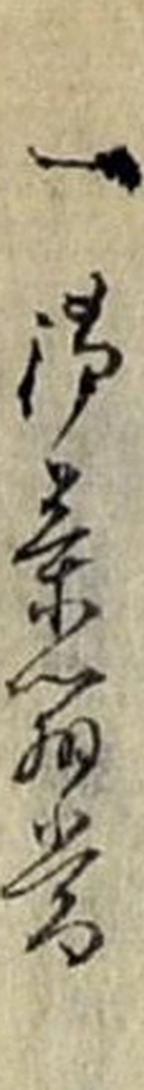一御茶弁当
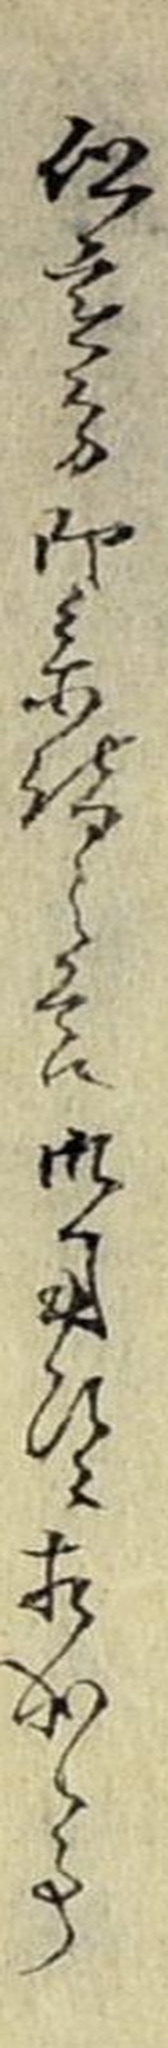但遠方御参詣之節は御用ひに相成候事
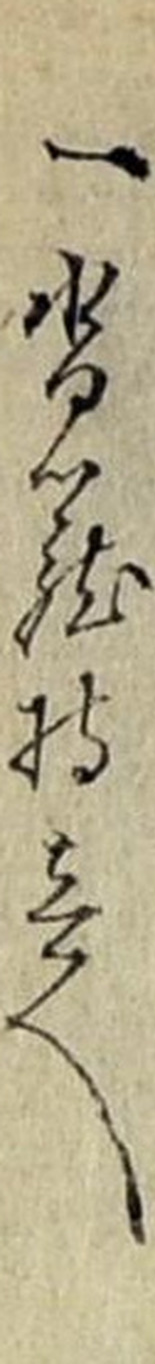一沓籠持壱人
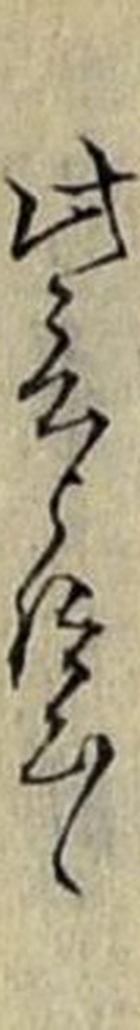此度被仰出候
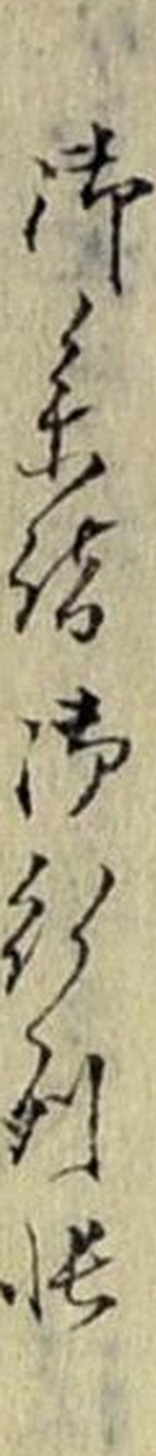御参詣御行列帳
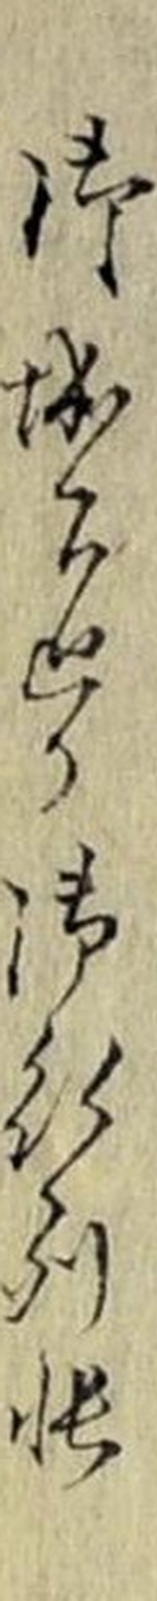御城下廻り御行列帳
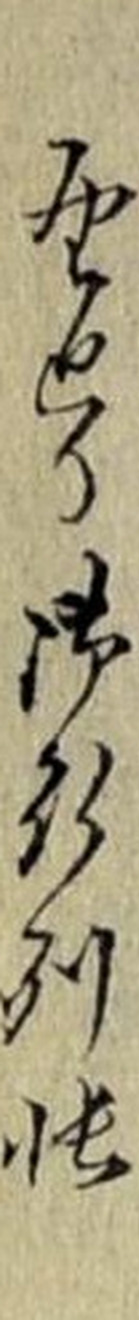野廻り御行列帳
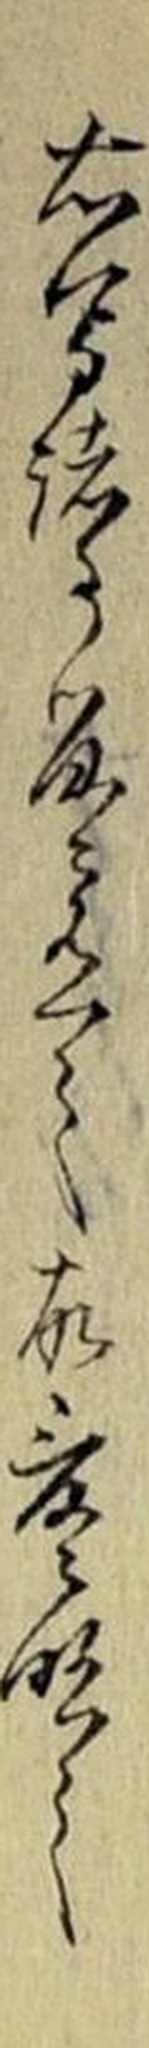右写諸事留に有之故爰に略之
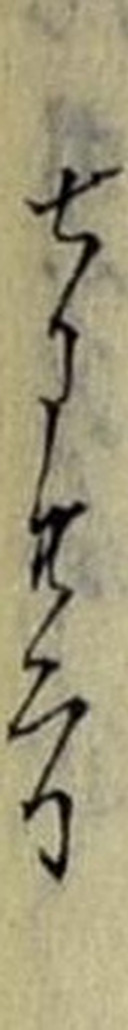七月廿二日
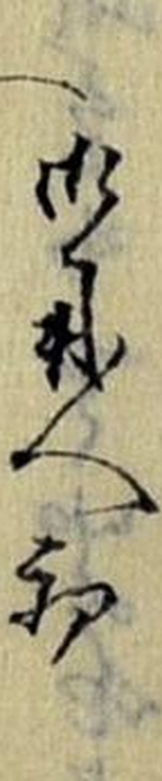御用人初
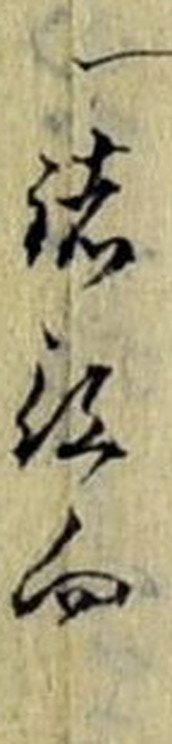諸役向
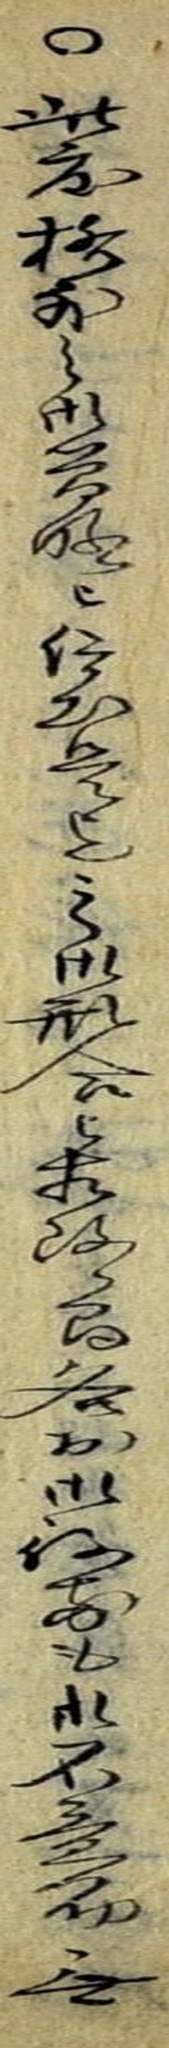○此度格別之御簡略被仰出是迄之御形合被相改候間各於御役前も御不益無
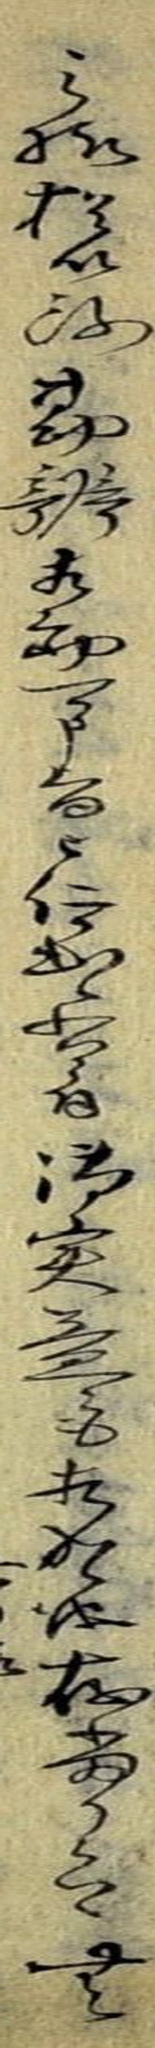之様猶以致勘弁相勤可申旨被仰出候右に付御実益にも相成候儀存当り候はヽ無
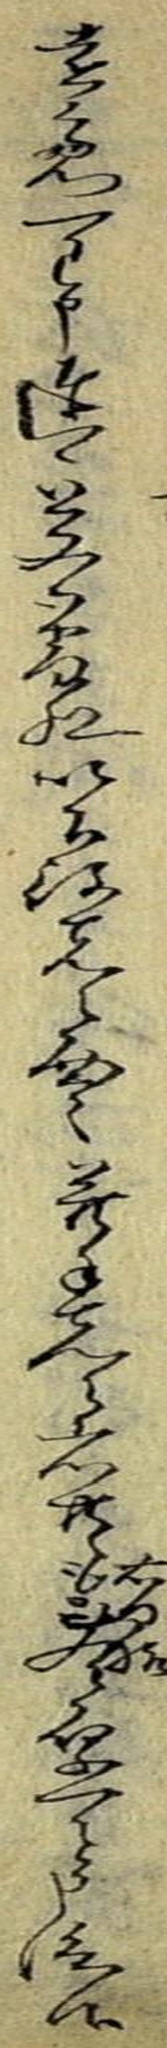遠慮可被申達候且又御番組以下役元之面々并手先之者共へも右同様夫々厚可被申渡候
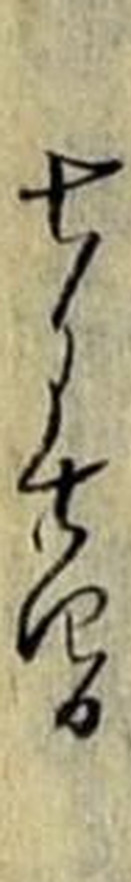七月廿四日
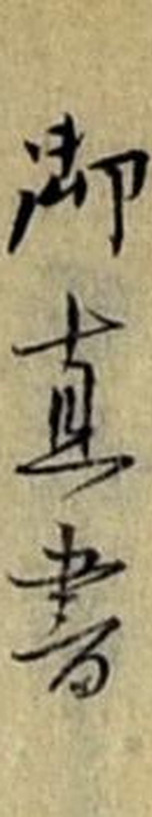御直書
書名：命令之部 六
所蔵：福井県文書館 Fukui Prefectural Archives
